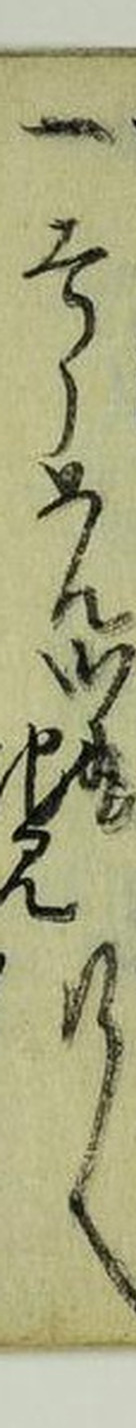一そうめん弐丸同人
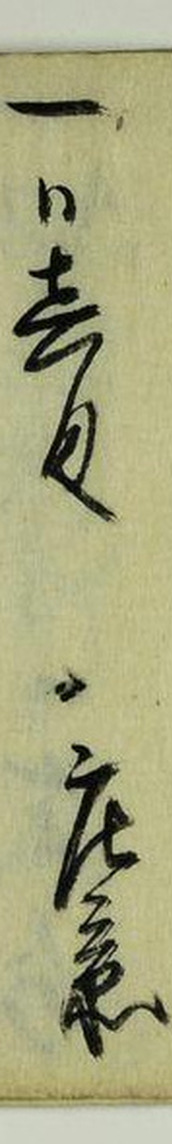一同壱匁庄兵衛
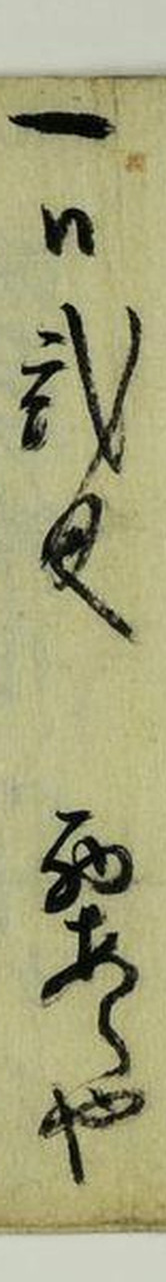一同弐匁西あらや
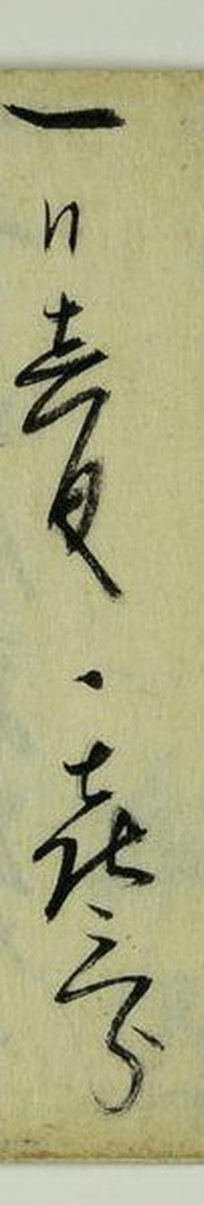一同壱匁喜三郎
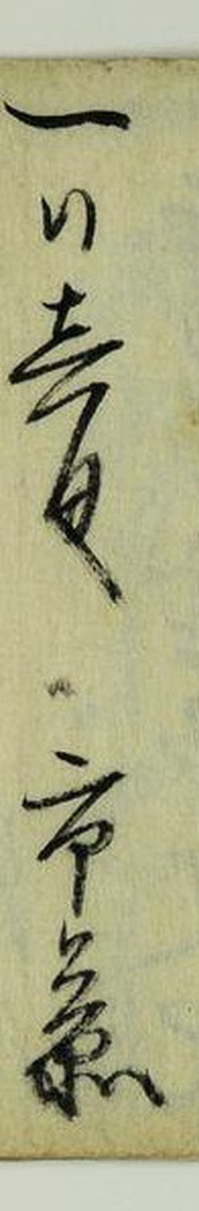一同壱匁市兵衛
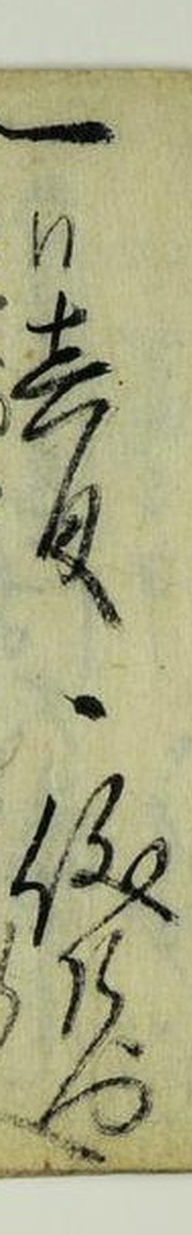一同壱匁儀左衛門
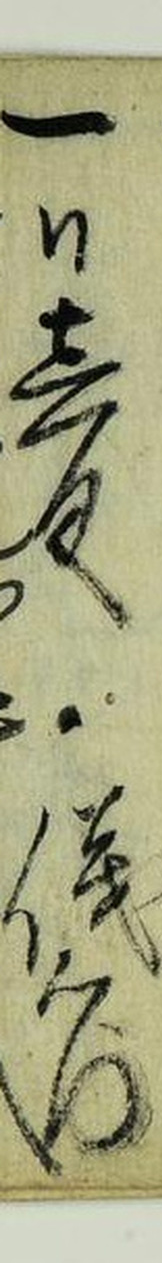一同壱匁儀右衛門
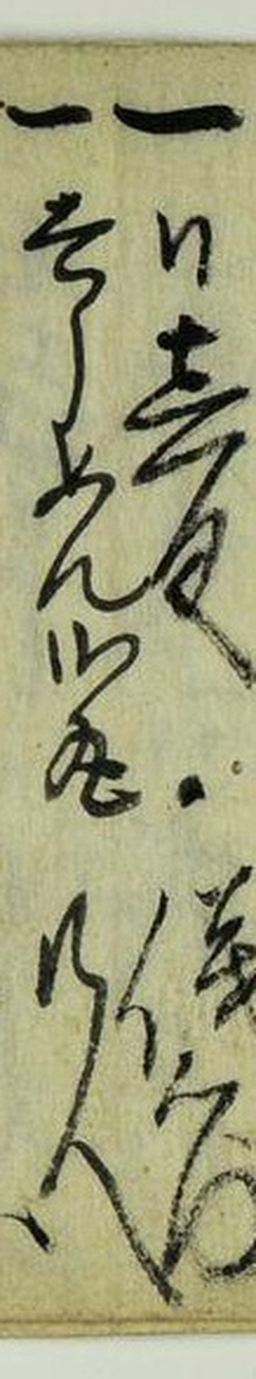一そうめん弐丸同人
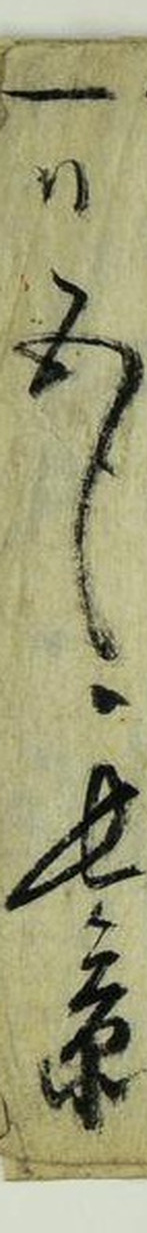一同五分長兵衛

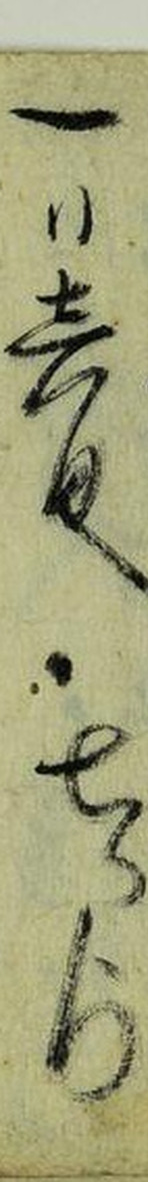一同壱匁七郎衛門
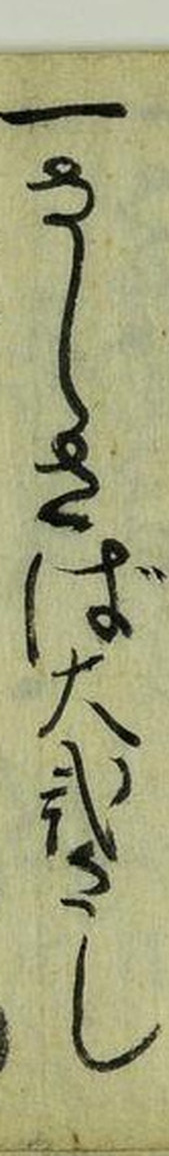一さしさば大二弐さし
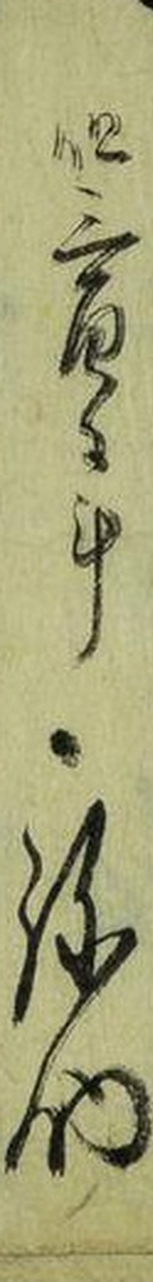但三百匁斗弥助
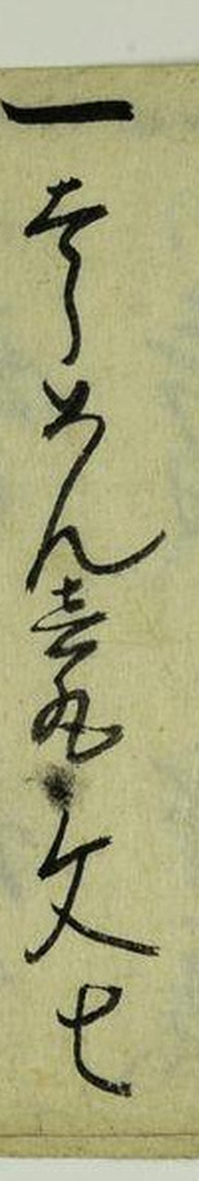一そうめん壱丸文七
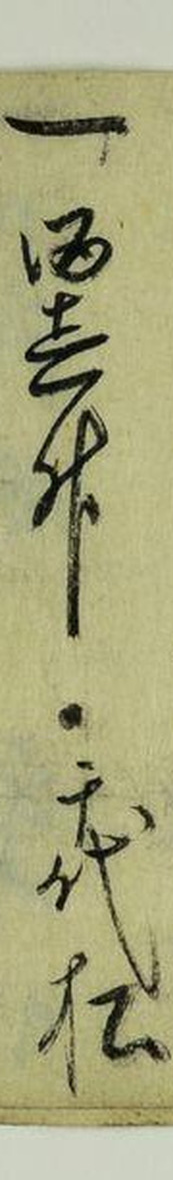一酒壱升千代松
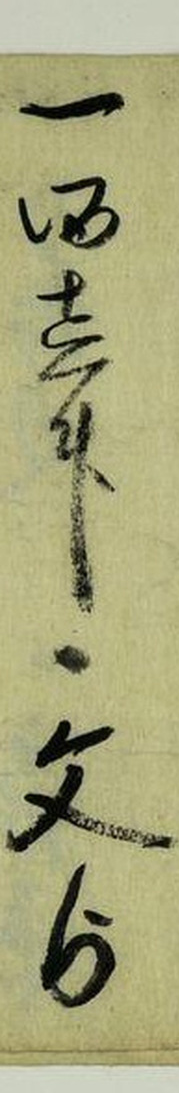一酒壱升文衛門
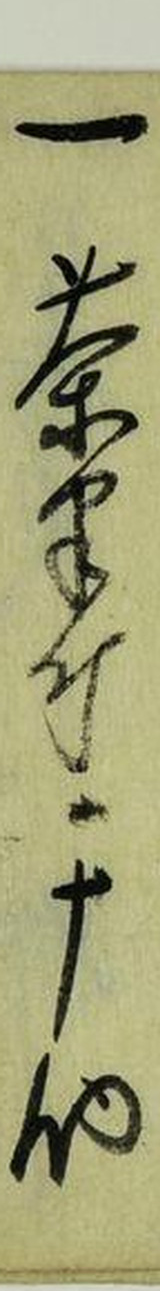一茶半斤十助
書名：松五郎参宮はなむけ并留守見舞
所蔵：福井県文書館 Fukui Prefectural Archives
